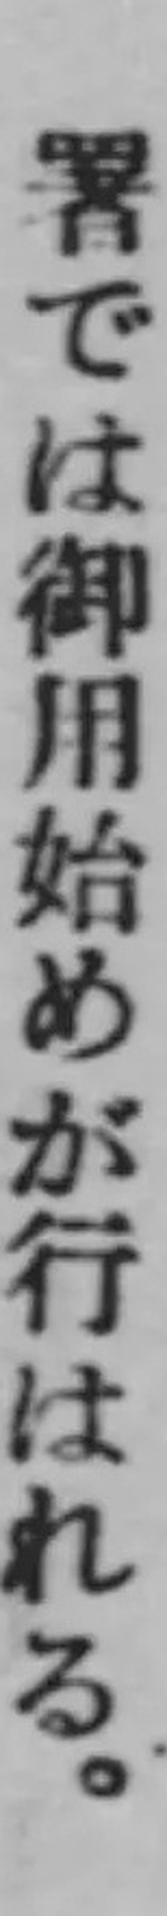署では御用始めが行はれる。
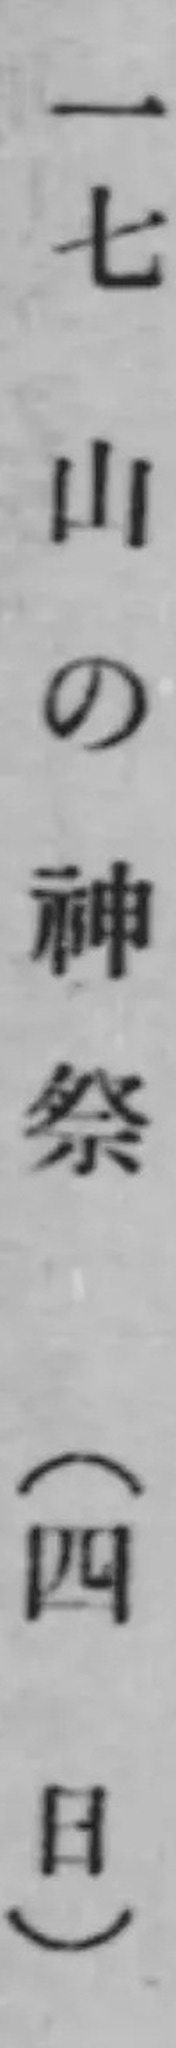一七山の神祭(四日)
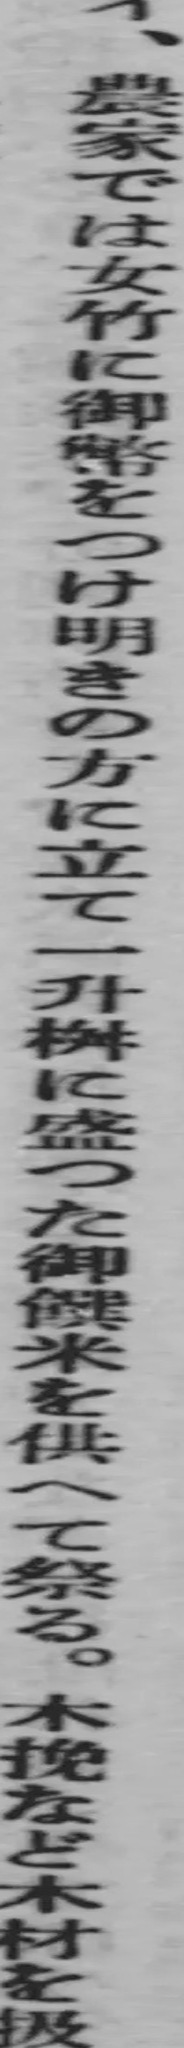イ、農家では女竹に御幣をつけ明きの方に立て一升桝に盛つた御饌米を供へて祭る。木挽など木材を扱
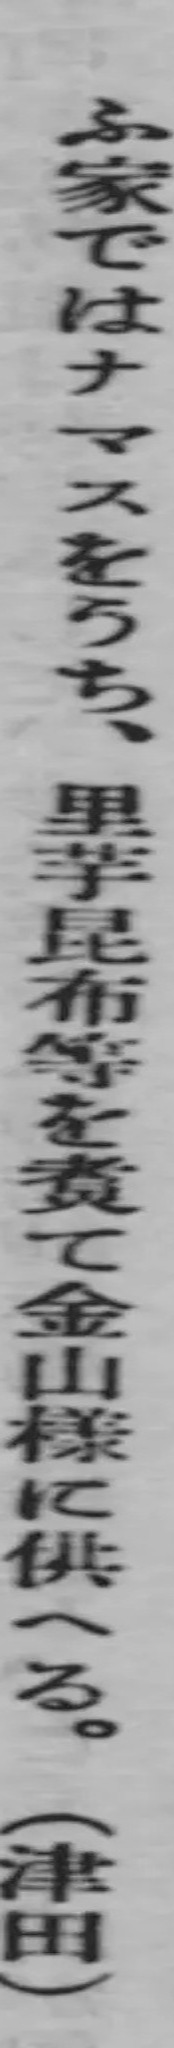ふ家ではナマスをうち、里芋昆布等を煑て金山様に供へる。(津田)
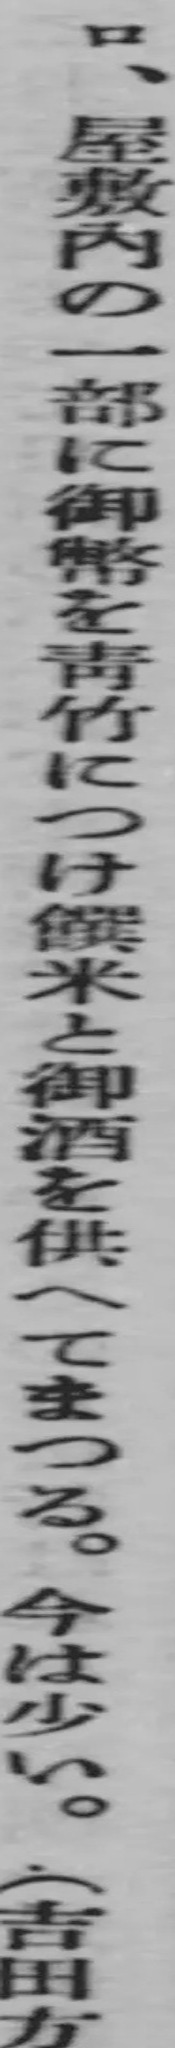ロ、屋敷内の一部に御幣を靑竹につけ饌米と御酒を供へてまつる。今は少い。(吉田方)
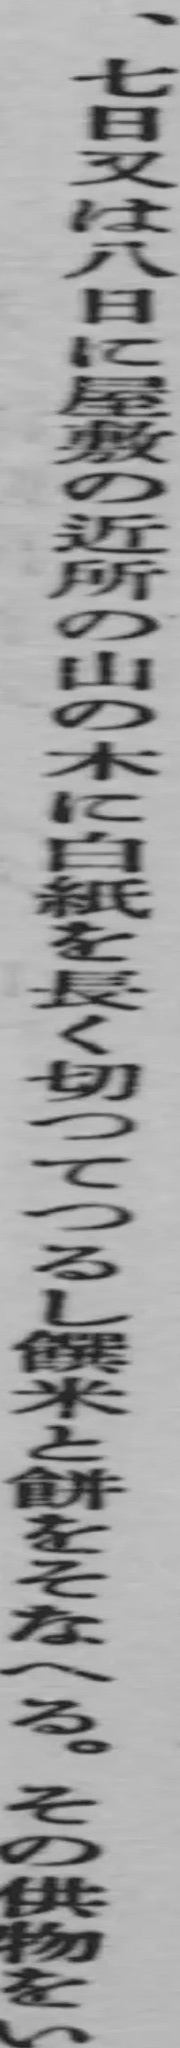ハ、七日又は八日に屋敷の近所の山の木に白紙を長く切つてつるし饌米と餅をそなへる。その供物をい
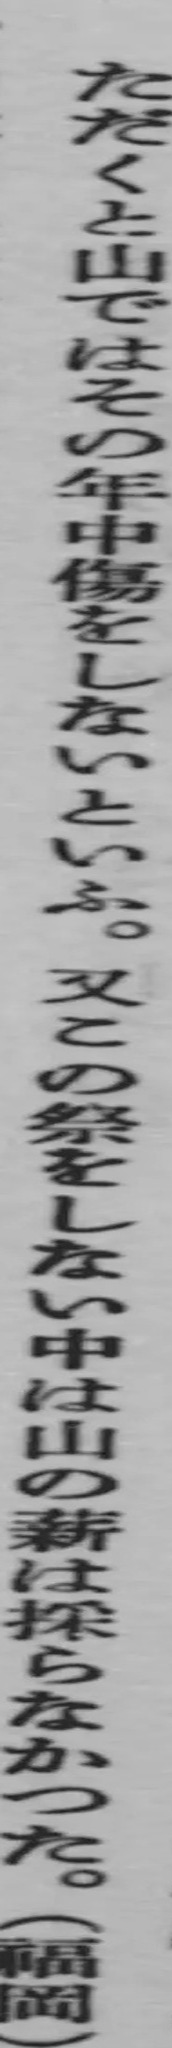ただくと山ではその年中傷をしないといふ。又この祭をしない中は山の薪は採らなかつた、(福岡)
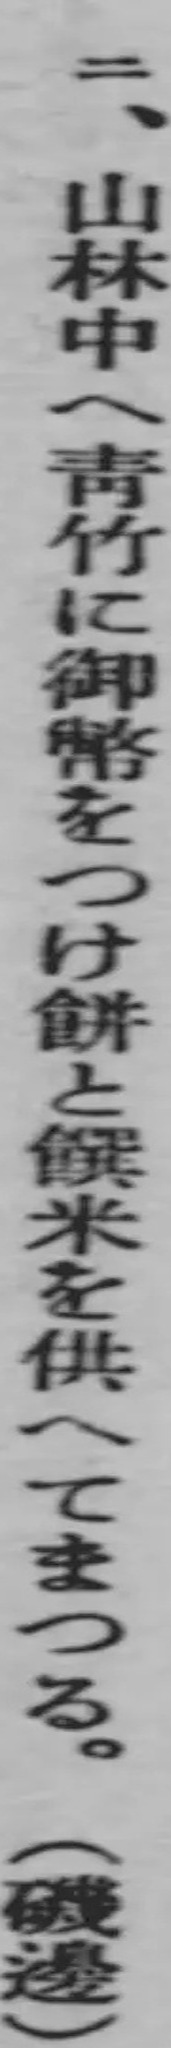ニ、山林中へ靑竹に御幣をつけ餅と饌米を供へてまつる。(磯邊)
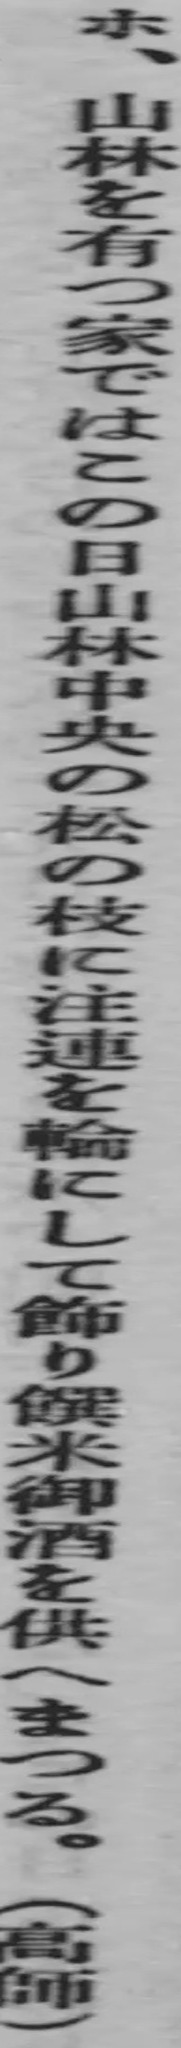ホ、山林を有つ家ではこの日山林中央の松の枝に注連を輪にして飾り饌米御酒を供へまつる。(高師)
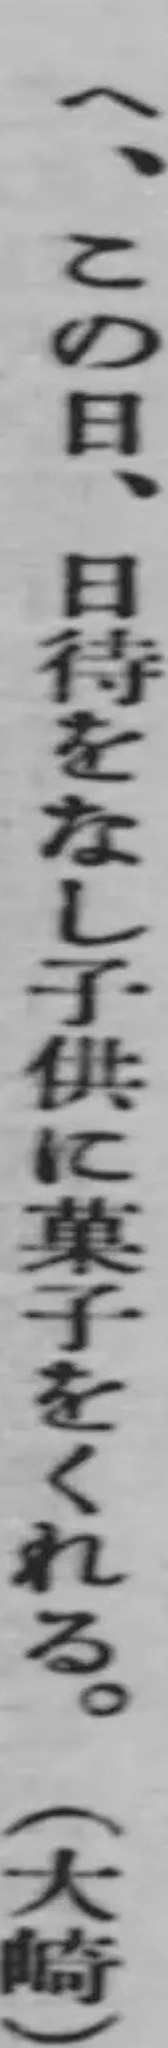ヘ、この日、日待をなし子供に菓子をくれる。(大崎)
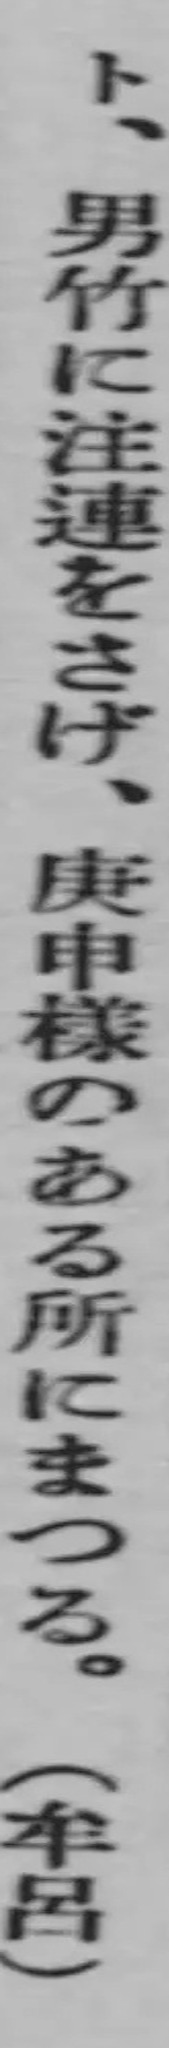ト、男竹に注連をさげ、庚申様のある所にまつる。(牟呂)
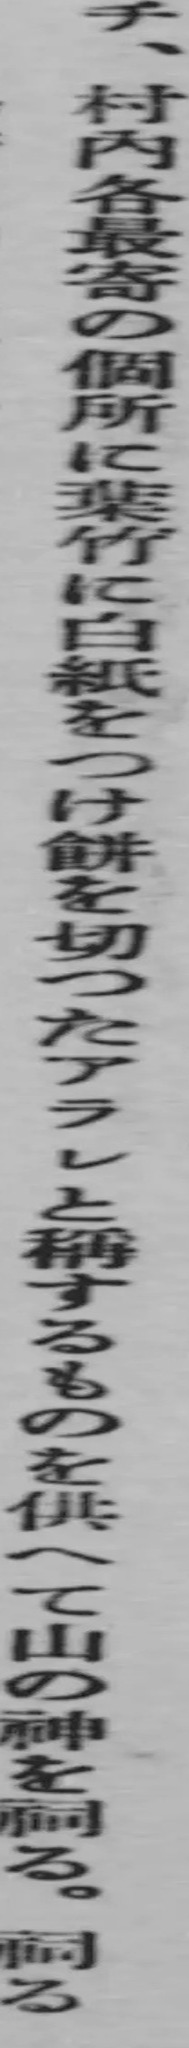チ、村内各最寄の個所に葉竹に白紙をつけ餅を切つたアラレと稱するものを供へて山の神を祠る。祠る
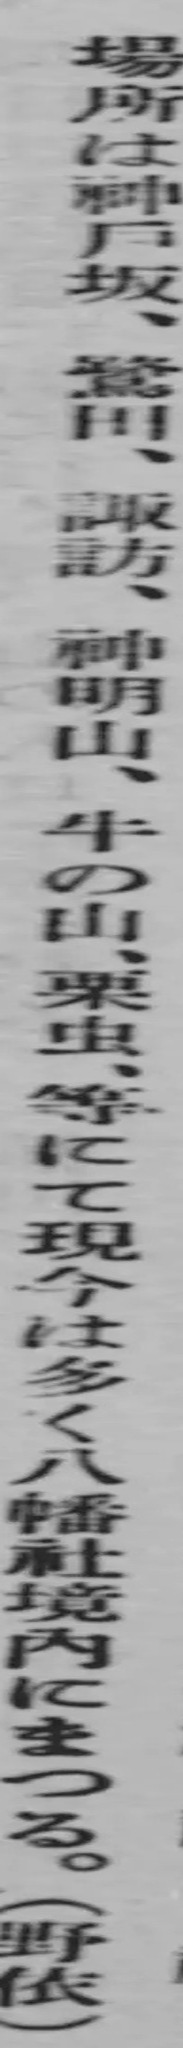場所は神戸坂、鷺田、諏訪、神明山、牛の山、栗虫、等にて現今は多く八幡社境内にまつる。(野依)

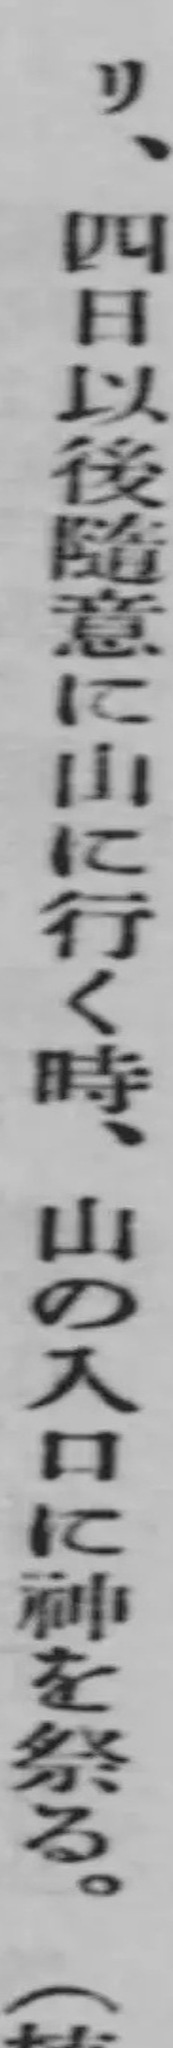り、四日以後随意に山に行く時、山の入口に神を祭る。(植田)
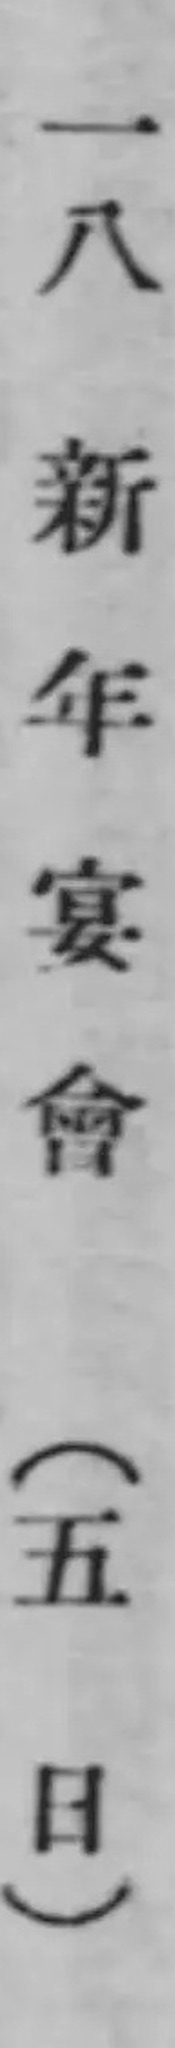一八新年宴會(五日)
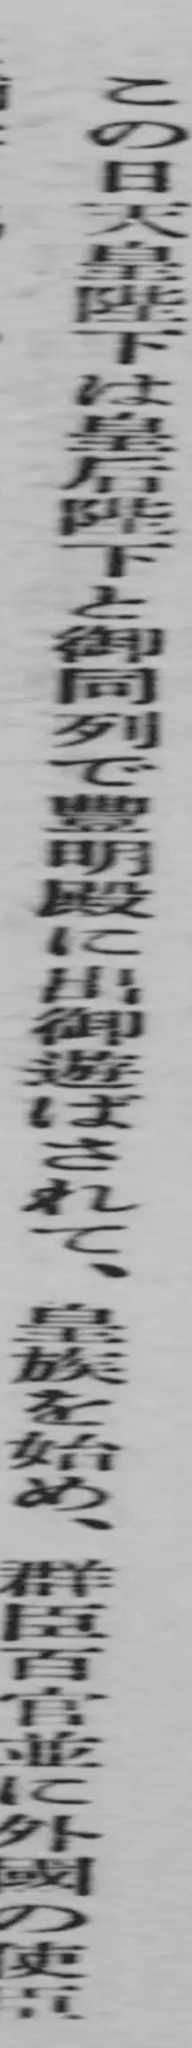この日天皇陛下は皇后陛下と御同列で豐明殿に出御遊ばされて皇族を始め、群臣百官並に外國の使臣
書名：豊橋の年中行事
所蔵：国立国会図書館 National Diet Library, JAPAN
